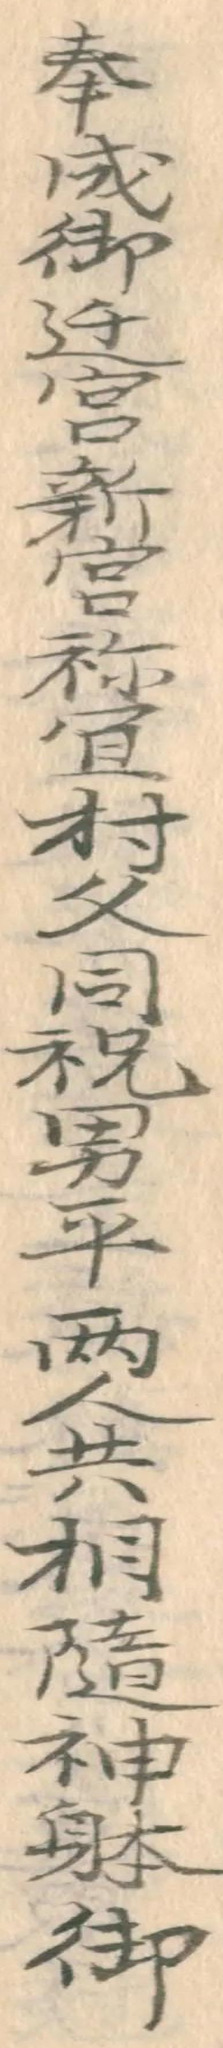奉成御遷宮新宮祢宜村久同祝男平両人共相隨神体御
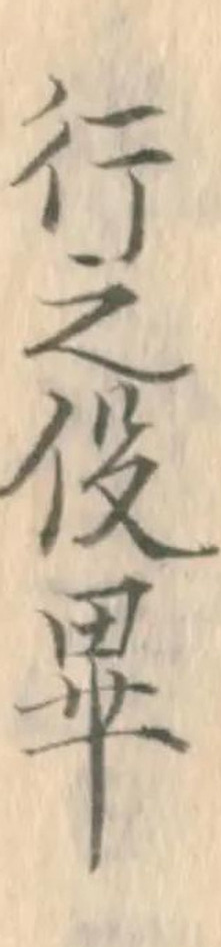行之役畢
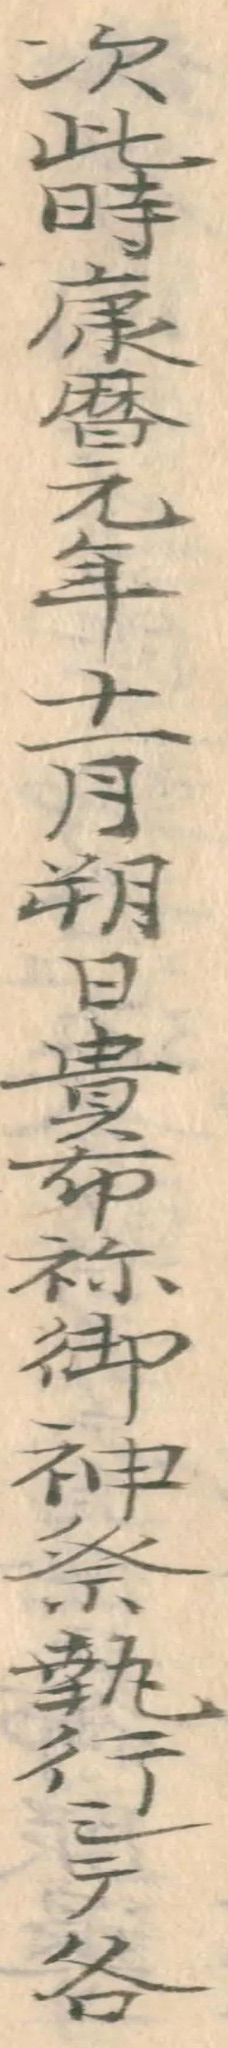次此時康暦元年十一月朔日貴布祢御神祭執行シテ各
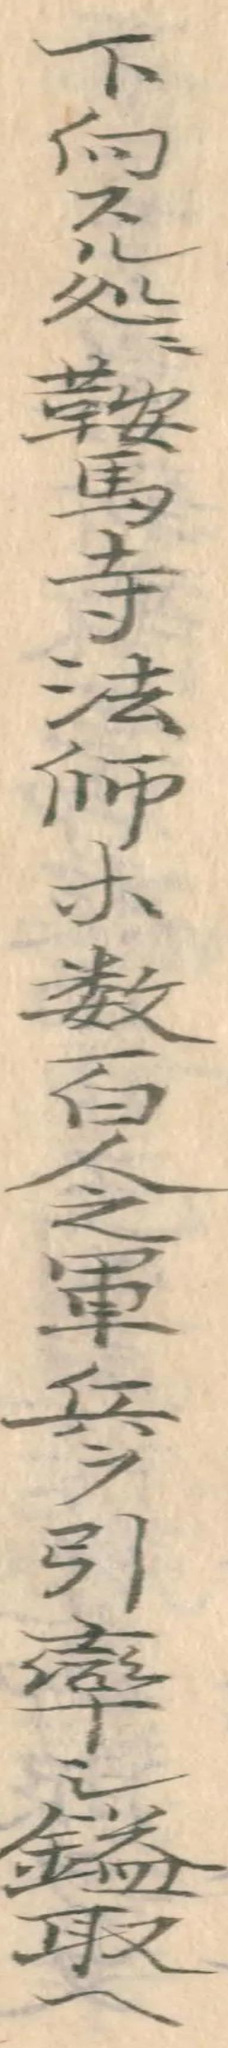下向スル処ニ鞍馬寺法師等数百人之軍兵ヲ引率シ鎰取ヘ
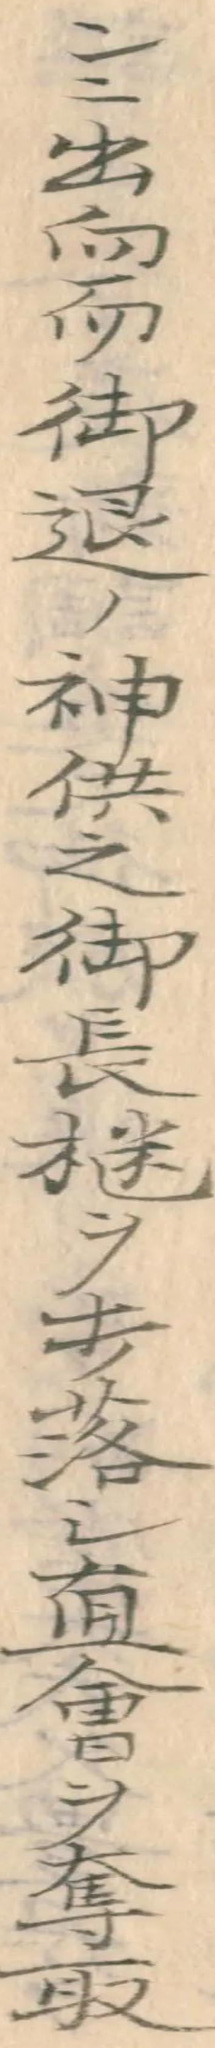ンニ出向而御退ノ神供之御長櫃ヲ打落シ直会ヲ奪取
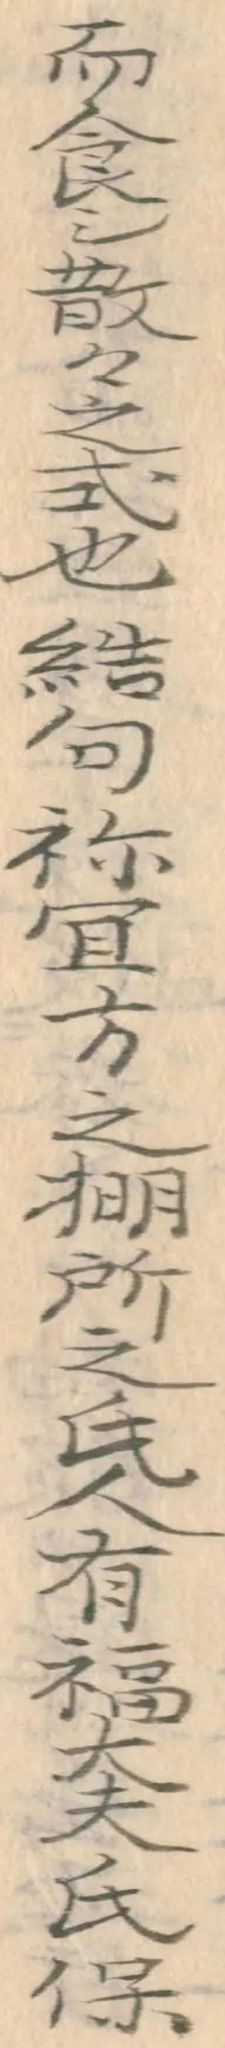而食シ散々之式也結句祢宜方之棚所之氏人有福大夫氏保
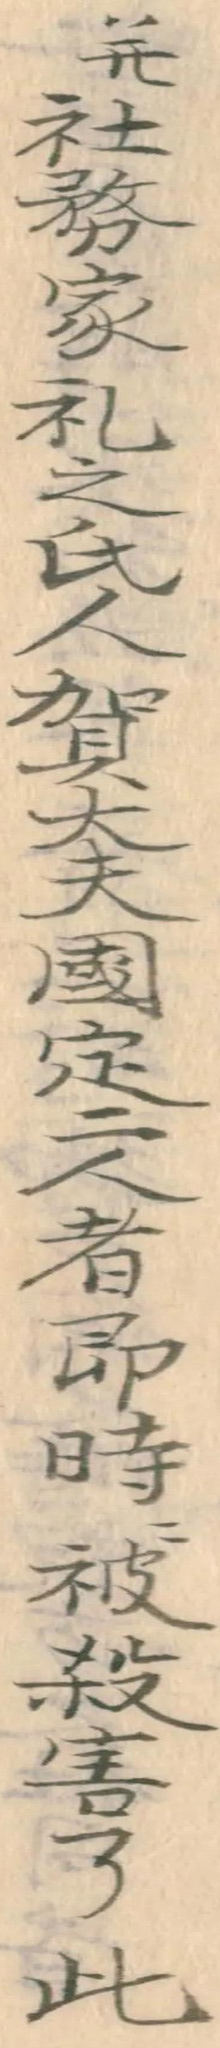并社務家礼之氏人賀大夫国定二人者即時ニ被殺害了此
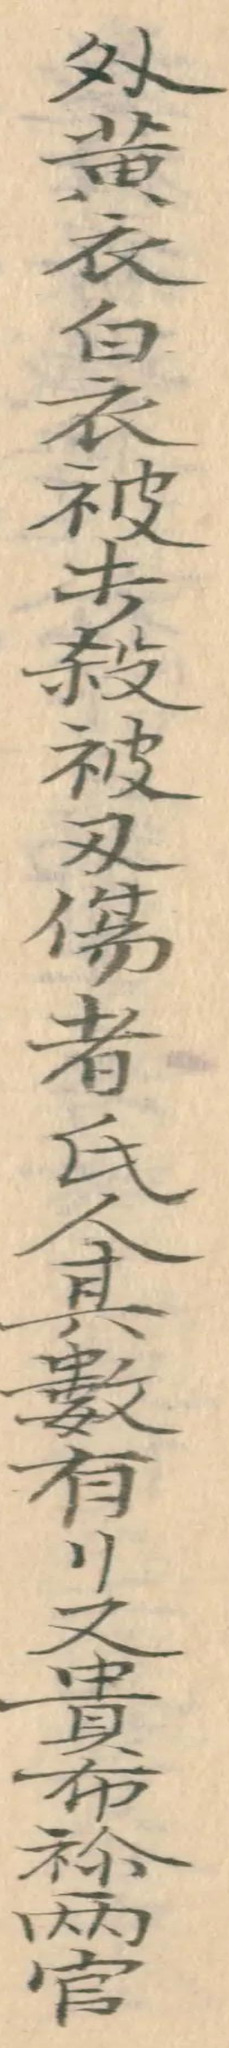外黄衣白衣被打殺被刃傷者氏人其数有リ又貴布祢両官
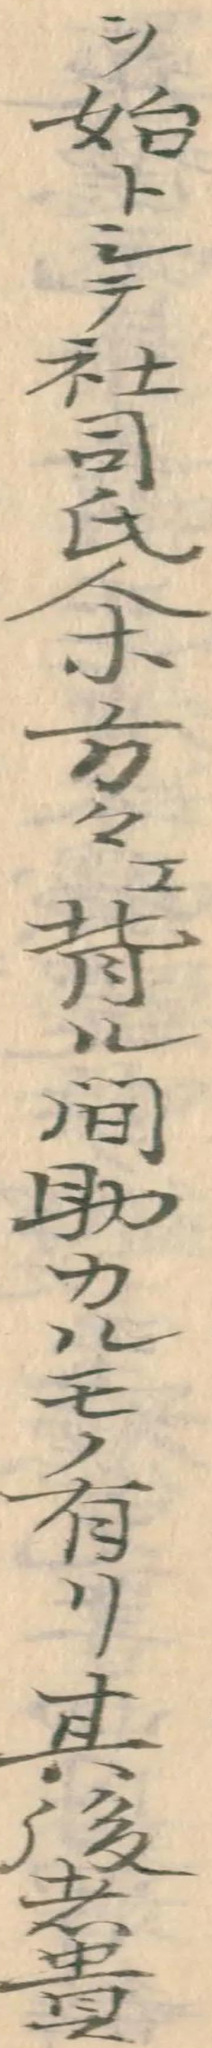ヲ始トシテ社司氏人等方々ェ背ル間助カルモノ有リ其後者責
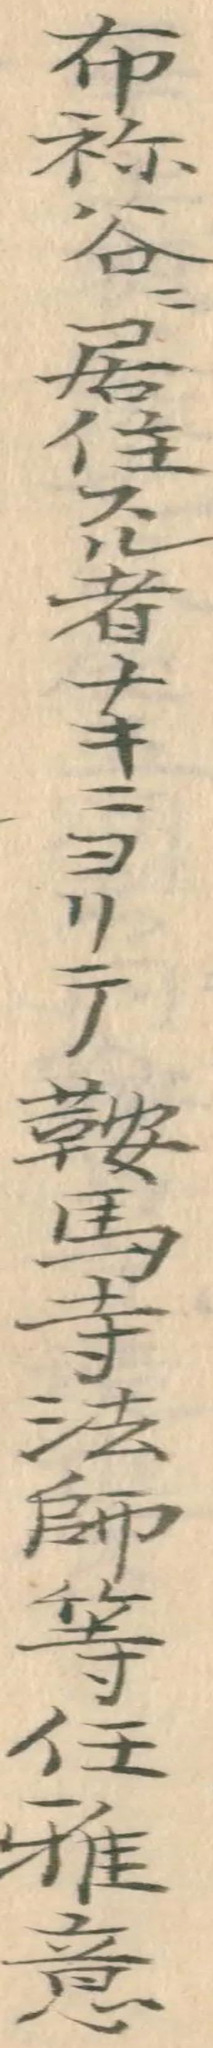布祢谷ニ居住スル者ナキニヨリテ鞍馬寺法師等任雅意
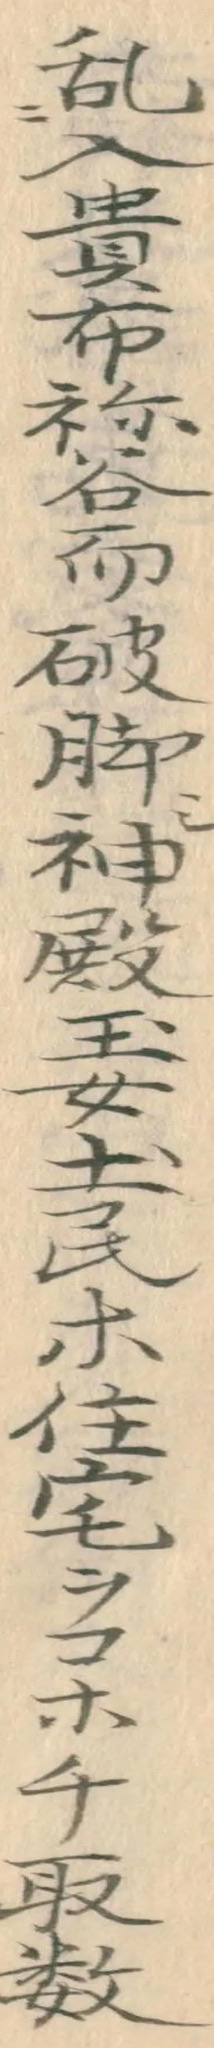乱ニ入貴布祢谷而破脚シ神殿玉女土民等住宅ヲコホチ取数
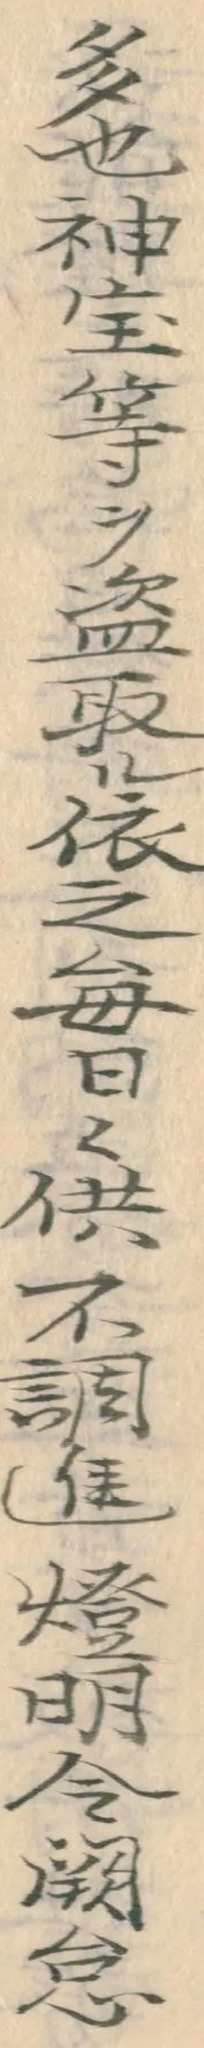多也神宝等ヲ盗取ル依之毎日々供不調進燈明令闕怠
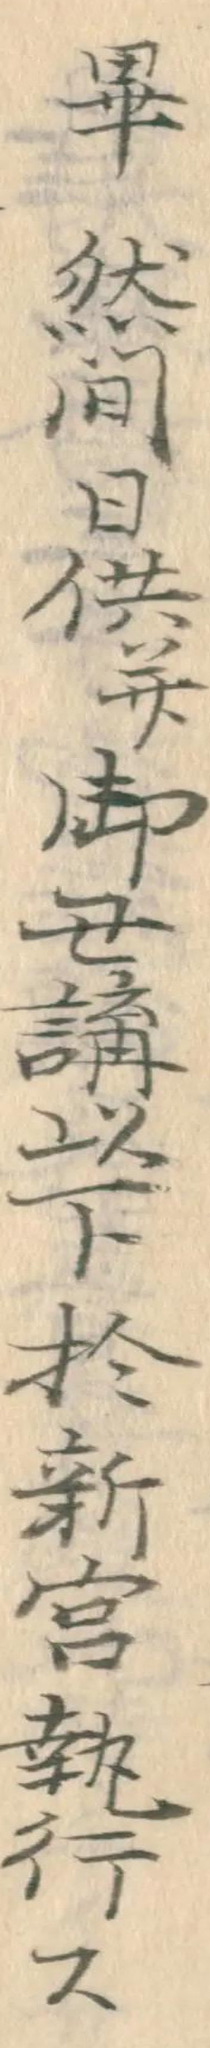畢然間日供并御丑講以下於新宮執行ス
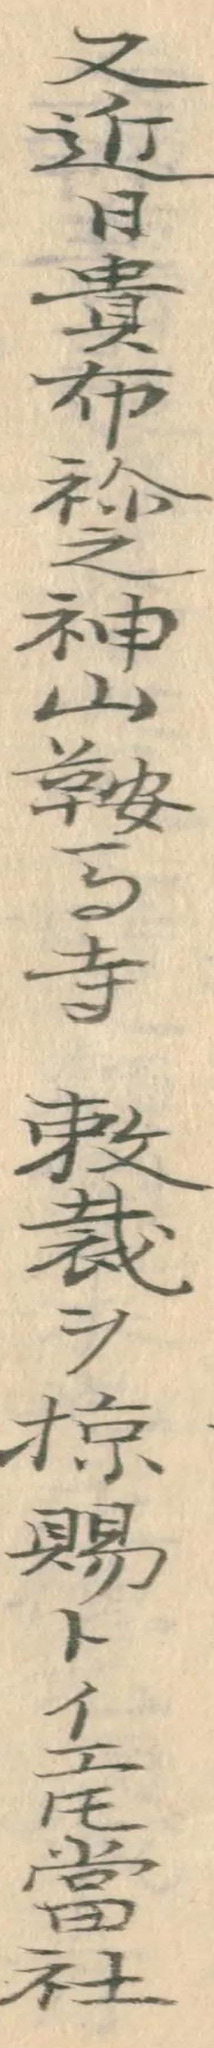又近日貴布祢之神山鞍馬寺敕裁ヲ掠賜トイエトモ当社
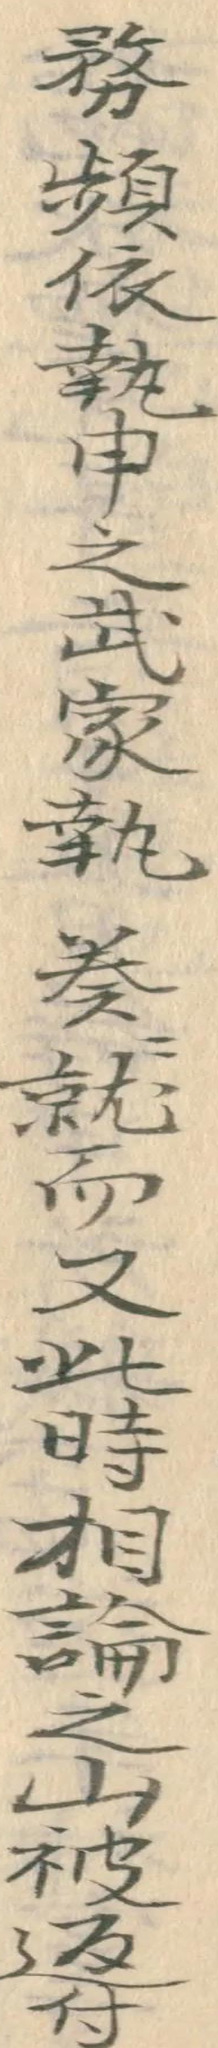務頻依執申之武家執奏ニ就而又此時相論之山被返付
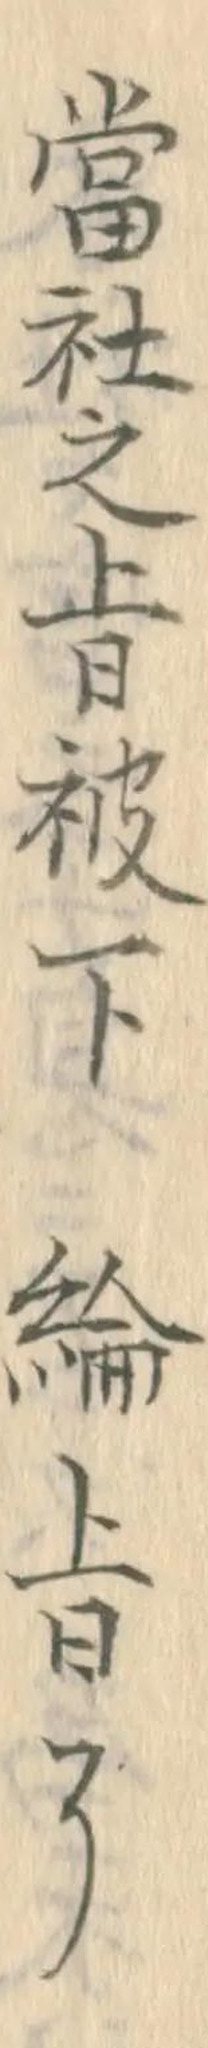当社之旨被下綸旨了
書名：賀茂社記録. 第24冊
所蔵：国立国会図書館 National Diet Library, JAPAN
